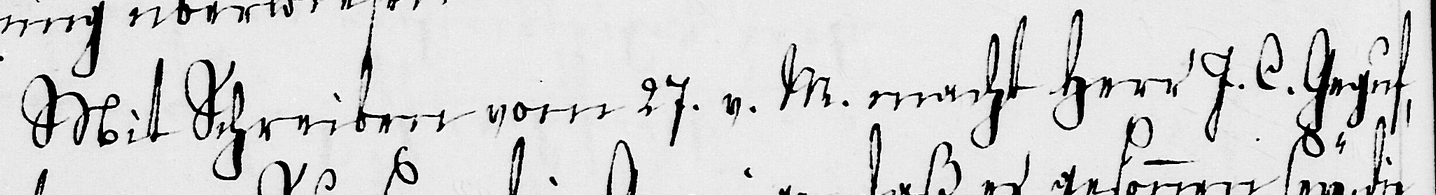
Mit Schreiben vom 27. v. M. macht Herr J. C. Geguf,
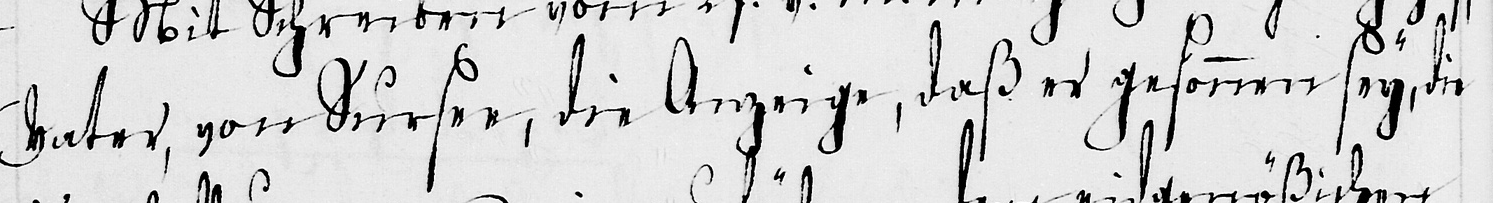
Vater, von Sursee, die Anzeige, daß er gesonnen sey, die
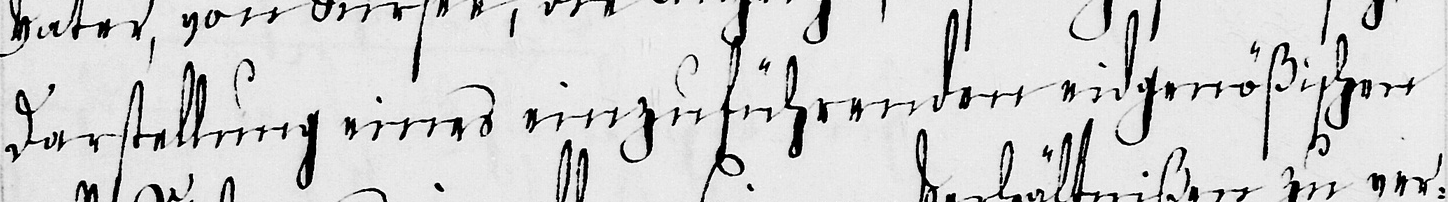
Darstellung eines einzuführenden eidgenößischen
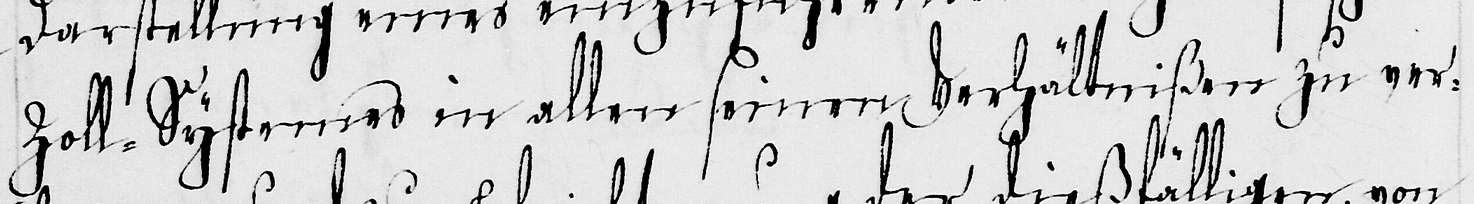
Zoll-Systemes in allen seinen Verhältnißen zu ver¬
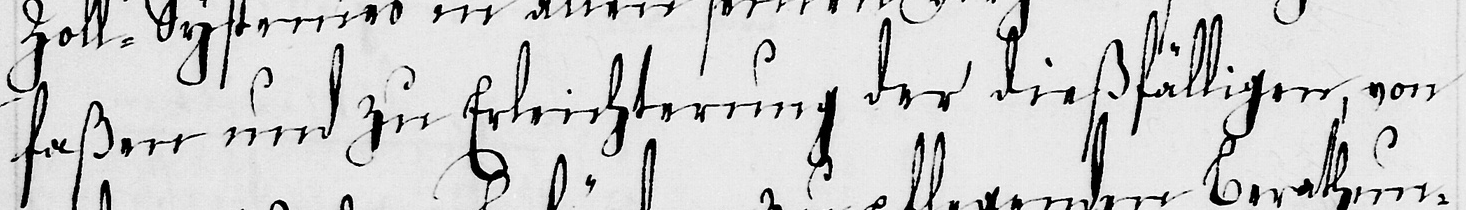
faßen und zu Erleichterung der dießfälligen, von
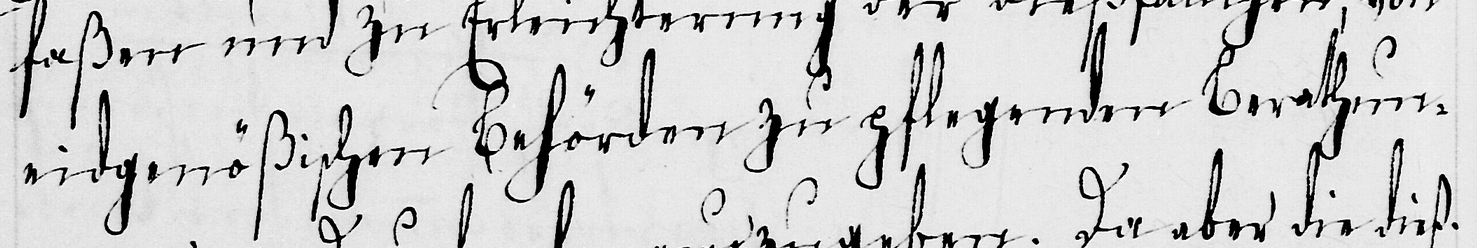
eidgenößischen Behörden zu pflegenden Berathun¬
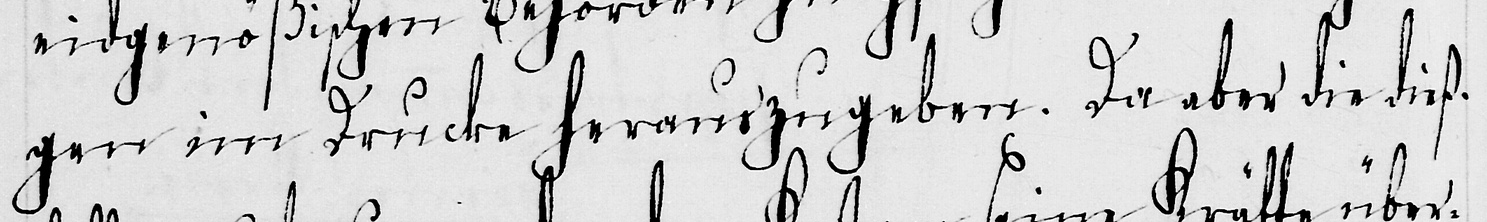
gen im Drucke herauszugeben. Da aber die dieß¬
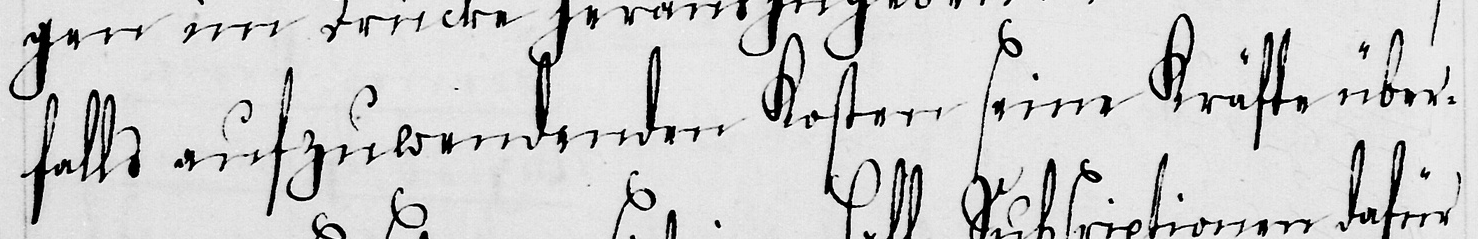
falls aufzuwendenden Kosten seine Kräfte über¬
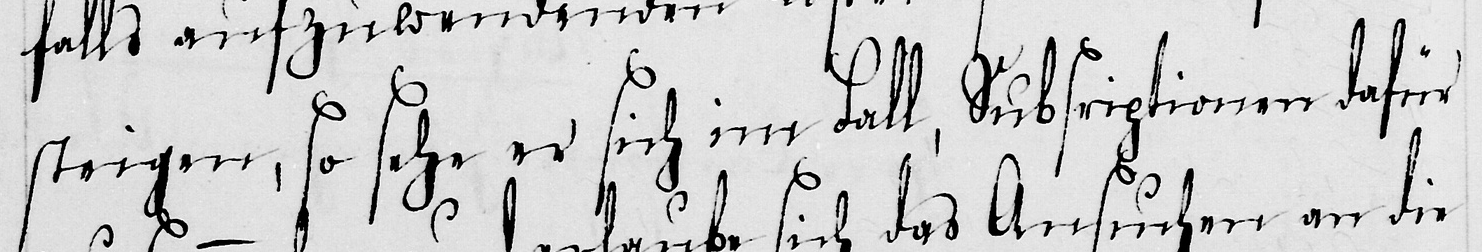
steigen, so sehe er sich im Fall, Subsriptionen
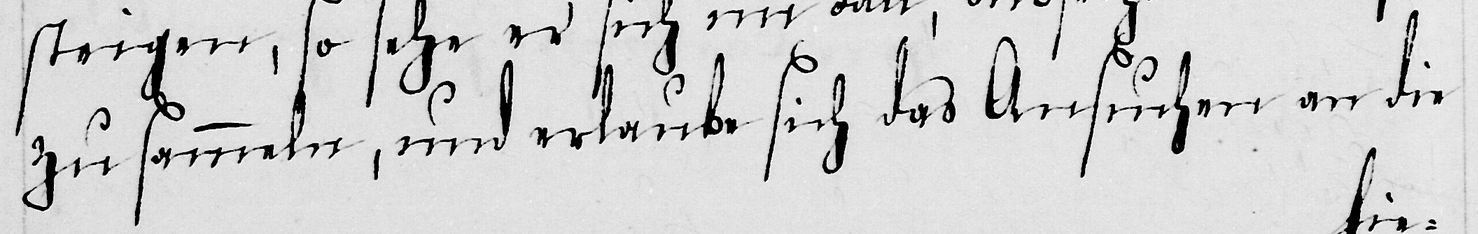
zu sammeln, und erlaube sich das Ansuchen an die
